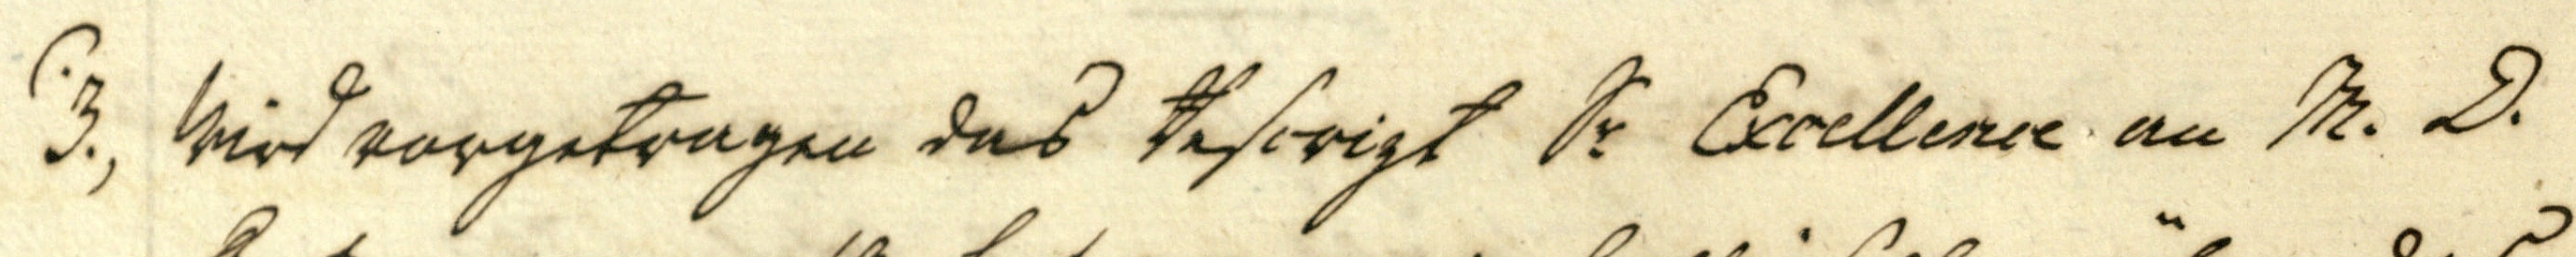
3., Wird vorgetragen das Rescript Sr Excellence an M. D.
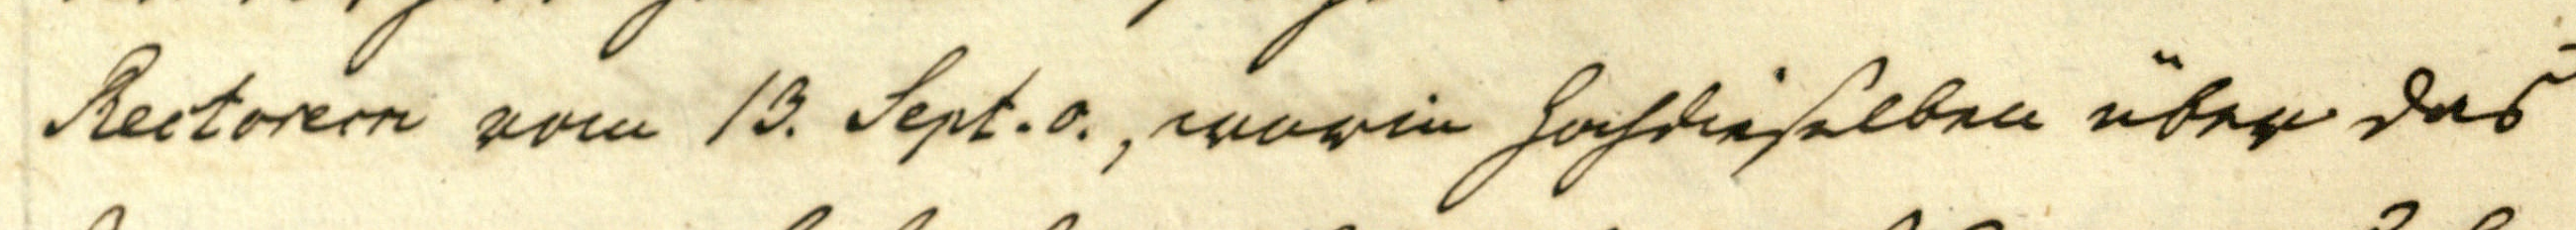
Rectorem vom 13. Sept. c., worin Hochdieselben über das
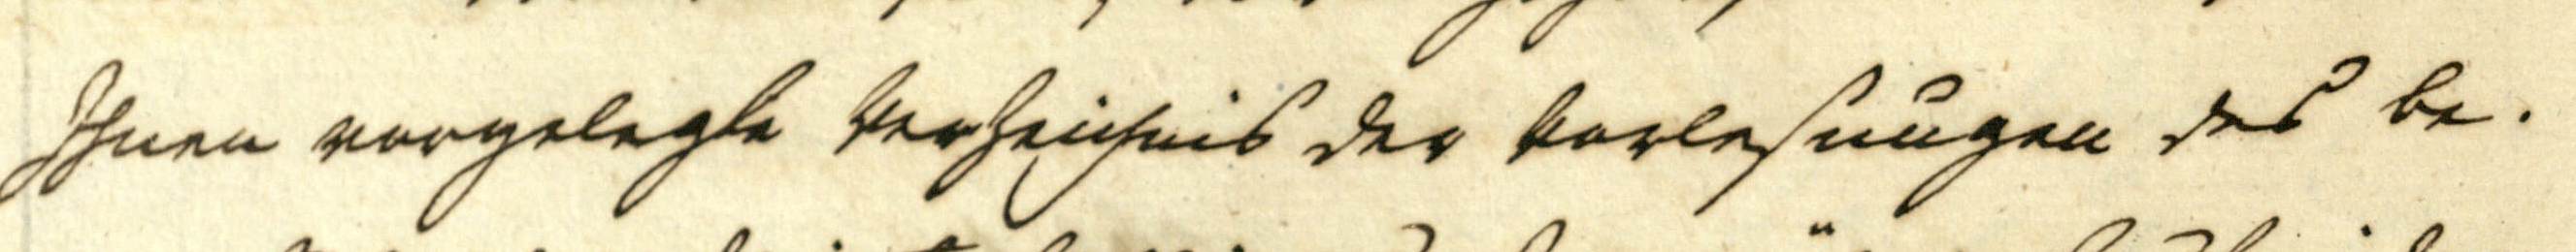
ihnen vorgelegte Verzeichnis der Vorlesungen des be¬
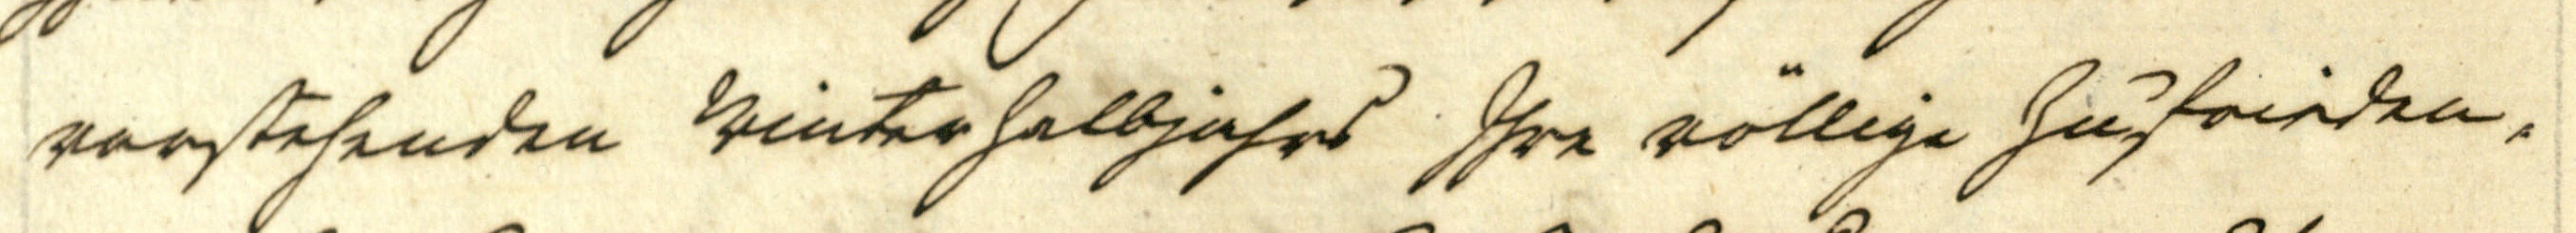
vorstehenden Winter Halbjahrs ihre völlige Zufrieden¬
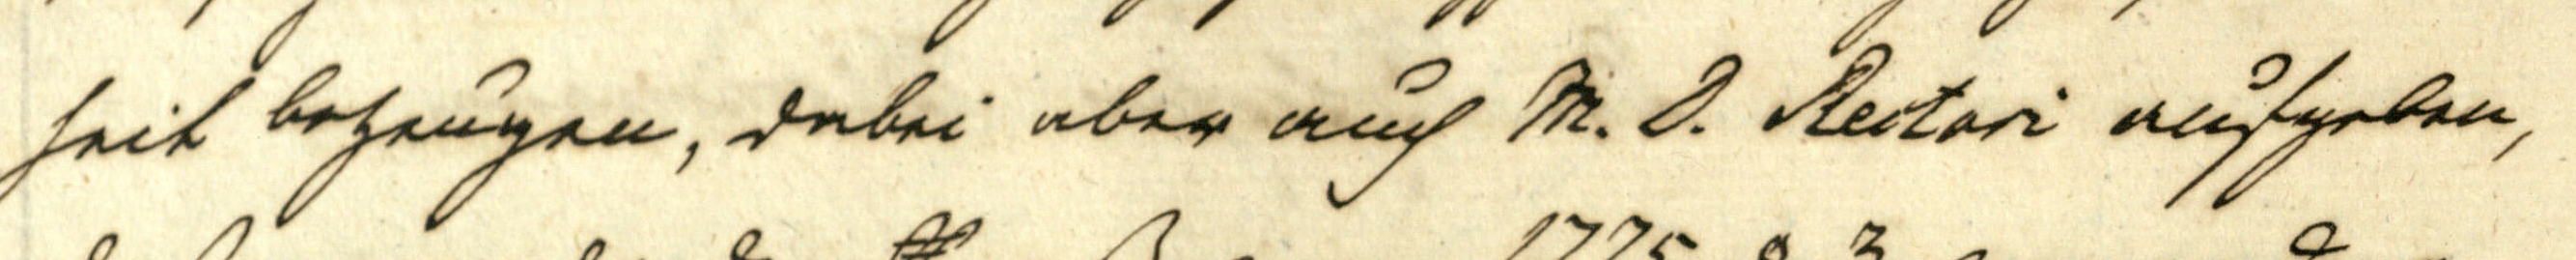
heit bezeugen, dabei aber auch M. D. Rectori aufgeben,
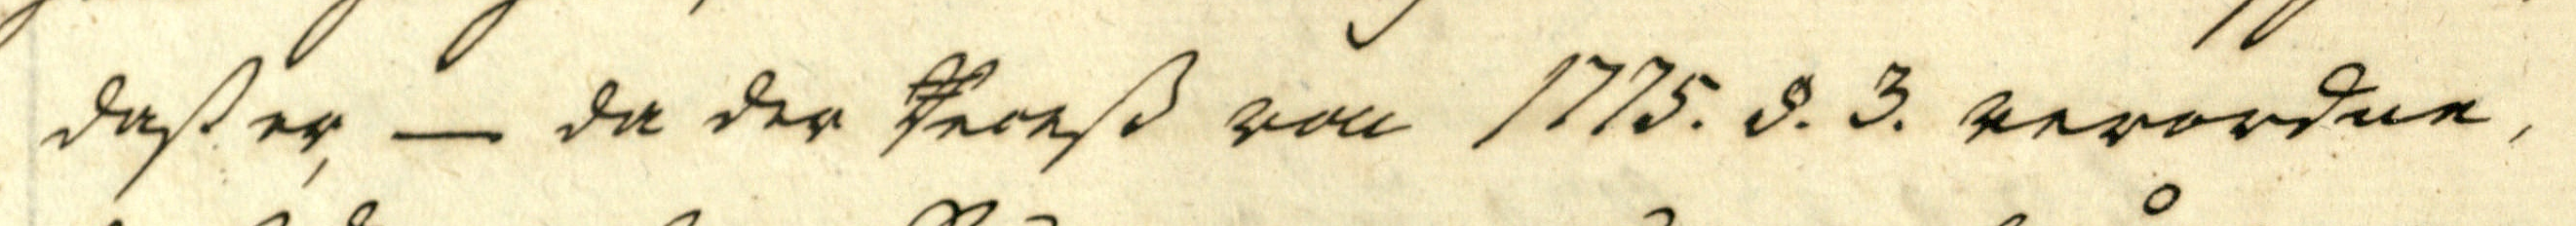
daß er, da der Receß von 1775. §. 3. verordne,
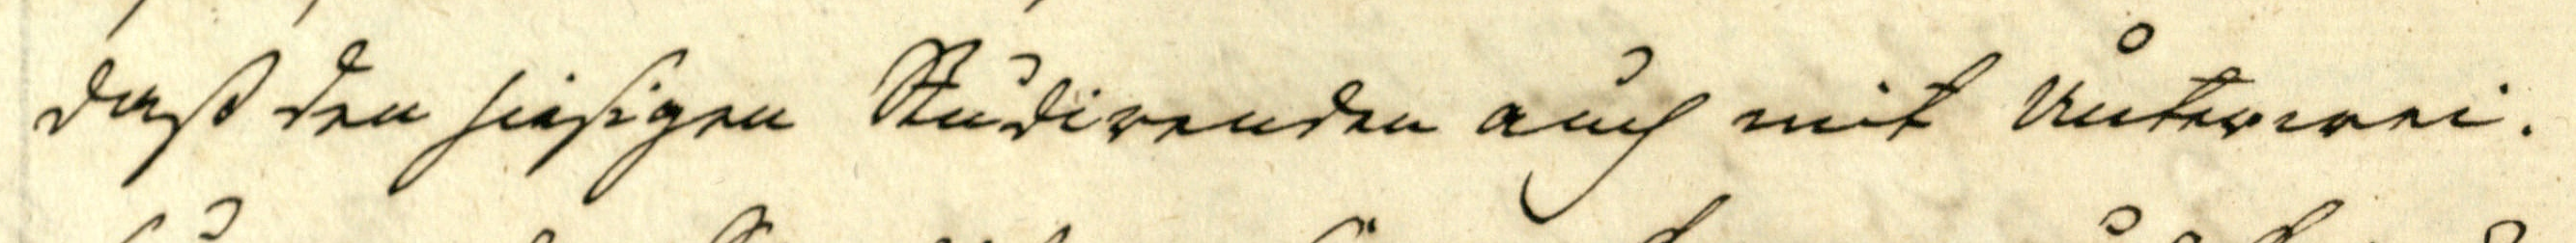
daß den hiesigen Studirenden auch mit Unterwei¬
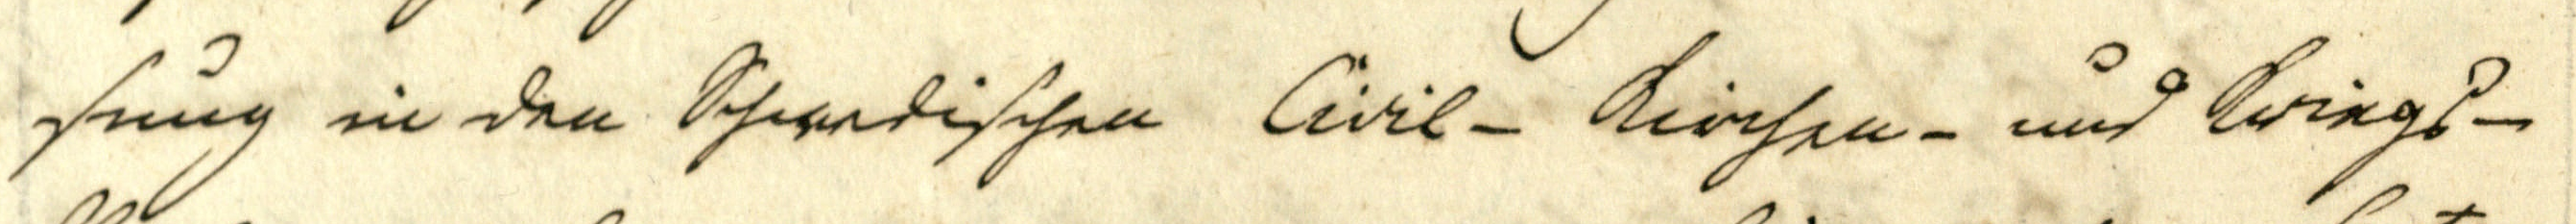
sung in den Schwedischen Civil- Kirchen- und Kriegs¬
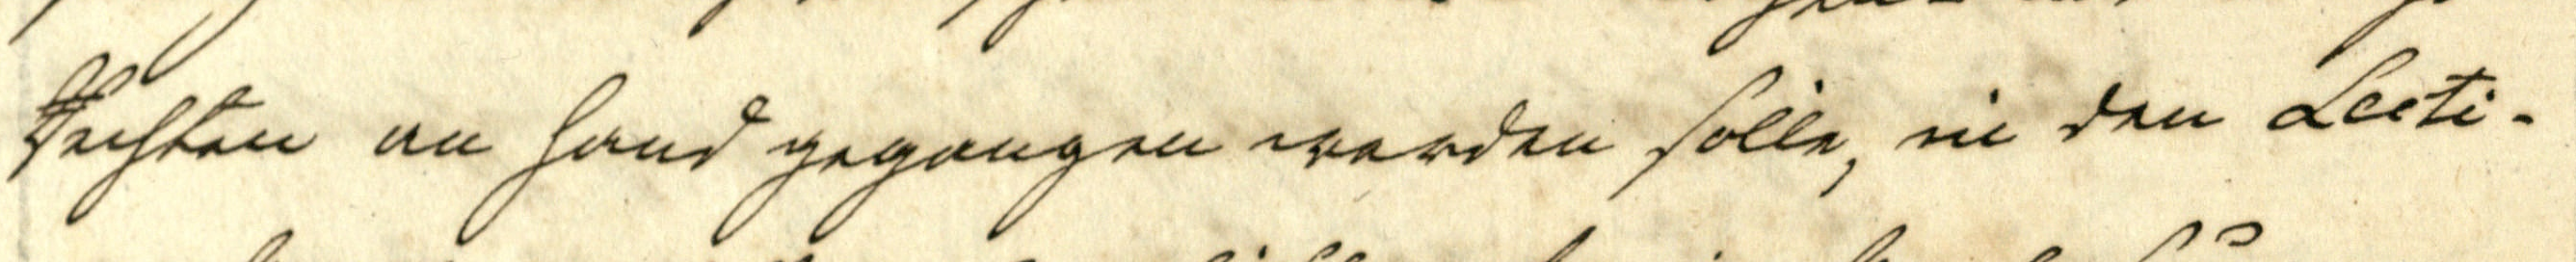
Rechten an hand gegangen werden solle, in den Lecti¬
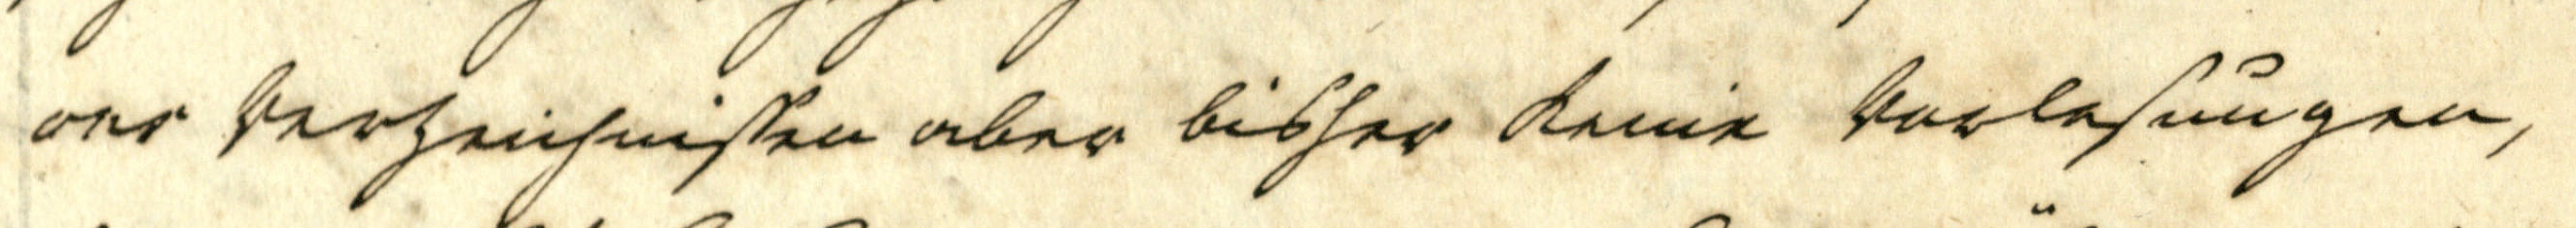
ons Verzeichnissen aber bisher keine Vorlesungen,
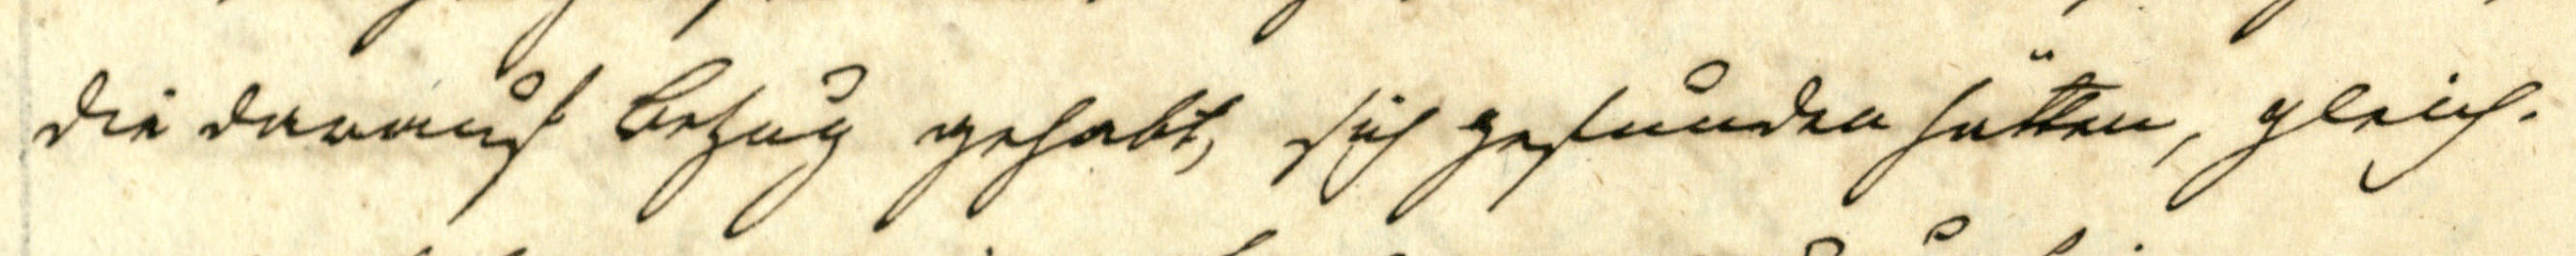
die darauf Bezug gehabt, sich gefunden hätten, gleich¬
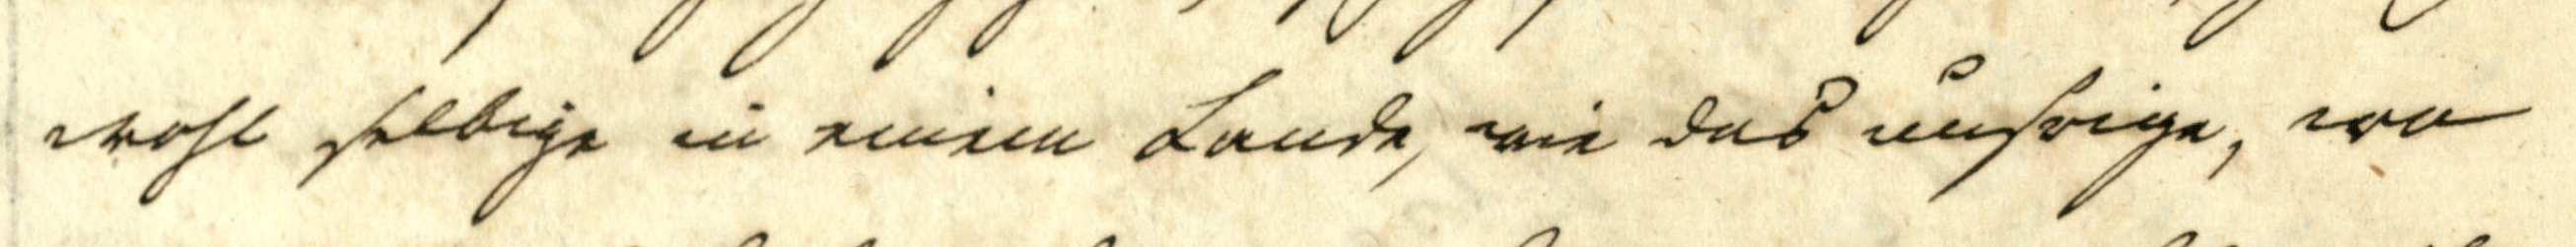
wohl selbige in einem Lande, wie das unsrige, wo
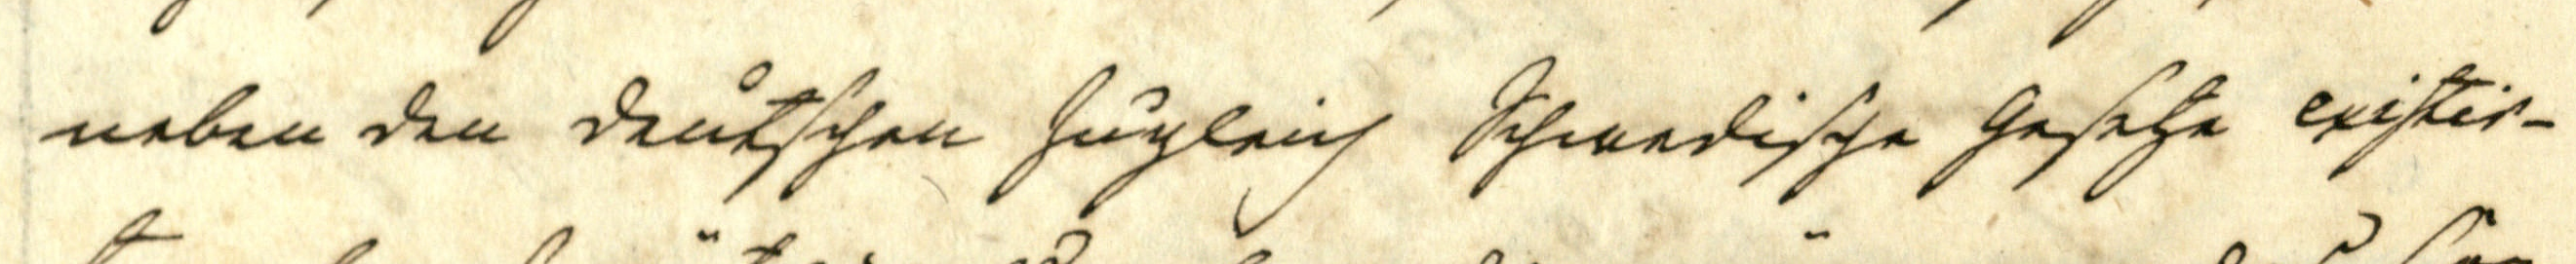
neben den deutschen zugleich Schwedische Gesetze existir¬
